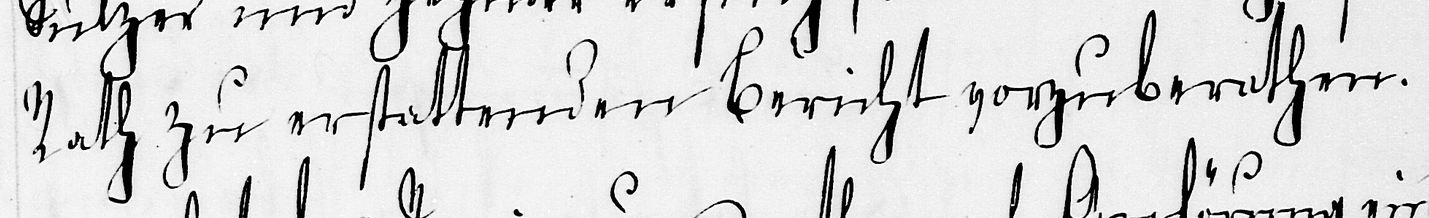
Rath zu erstattenden Bericht vorzuberathen.
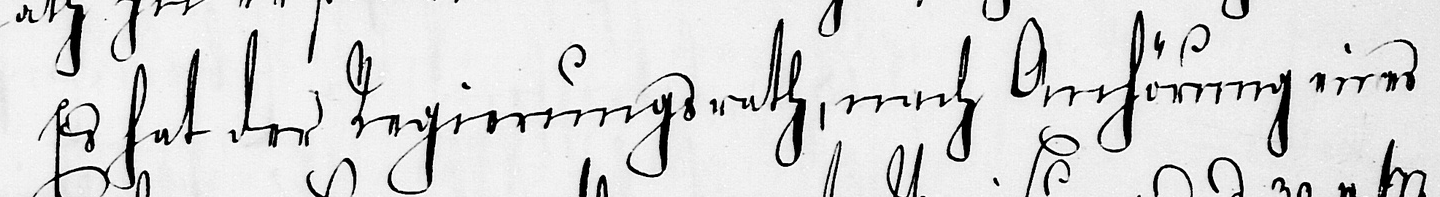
Es hat der Regierungsrath, nach Anhörung eines
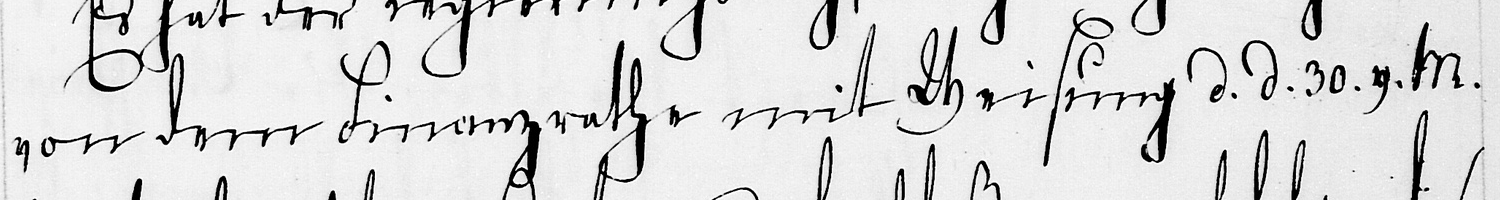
von dem Finanzrathe mit Weisung d. d. 30. v. M.
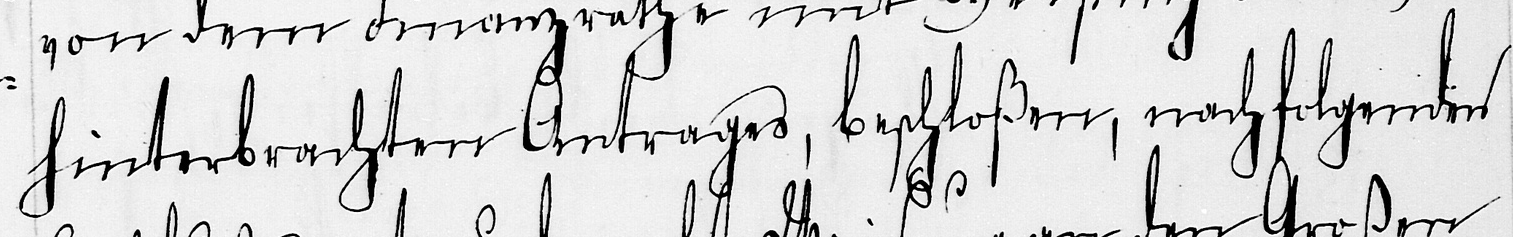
hinterbrachten Antrages, beschloßen, nachfolgenden
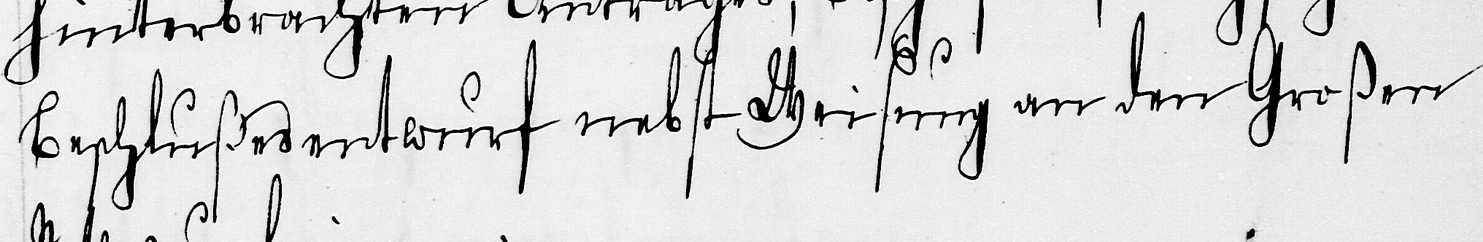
Beschlußesentwurf nebst Weisung an den Großen
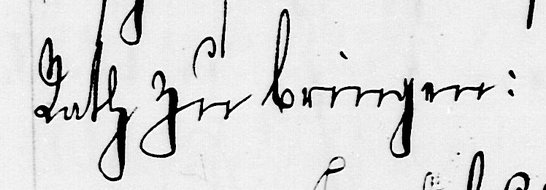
Rath zu bringen:
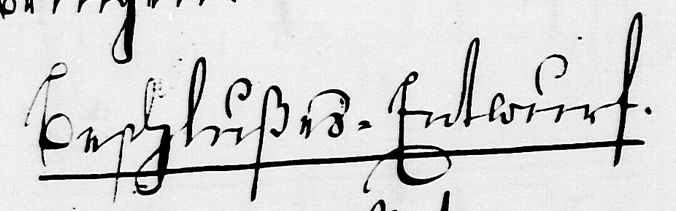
Beschlußes-Entwurf.
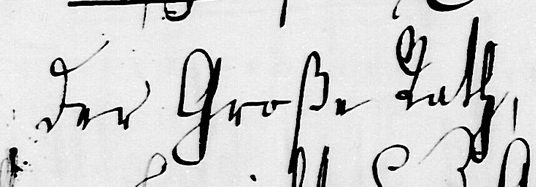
Der Große Rath,
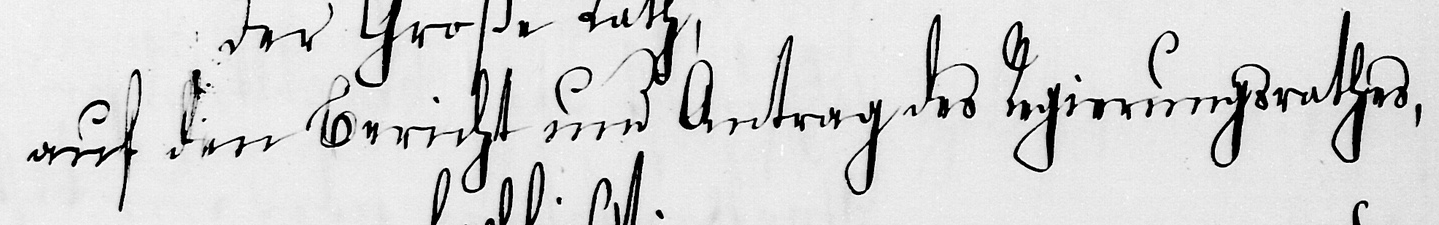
auf den Bericht und Antrag des Regierungsrathes,
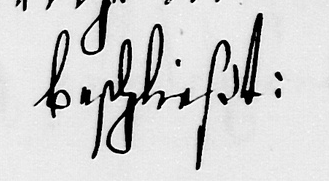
beschließt:
